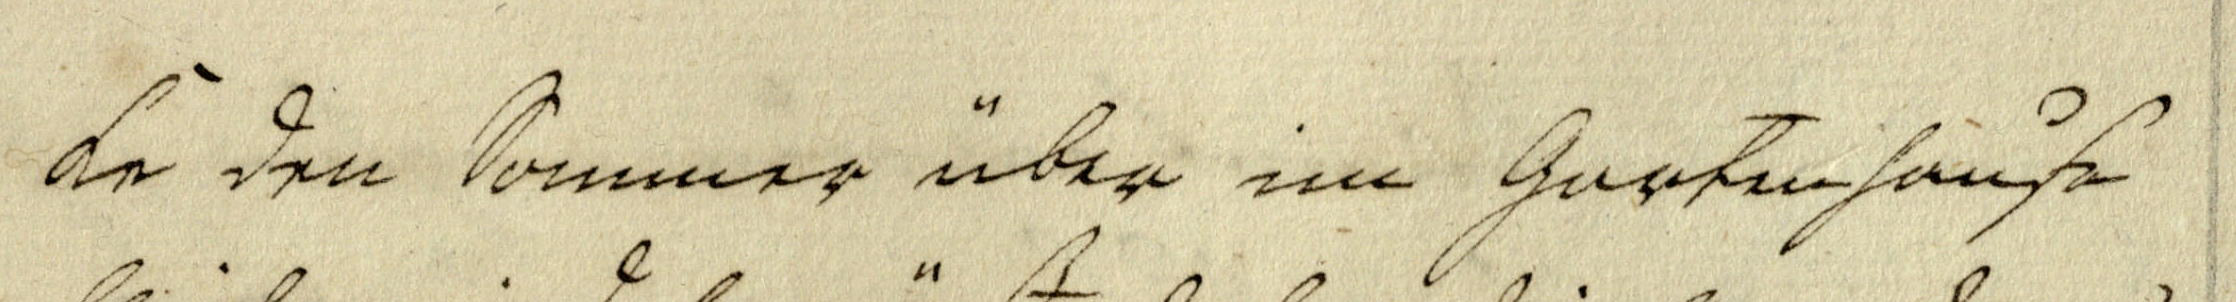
ke den Sommer über im Gartenhause
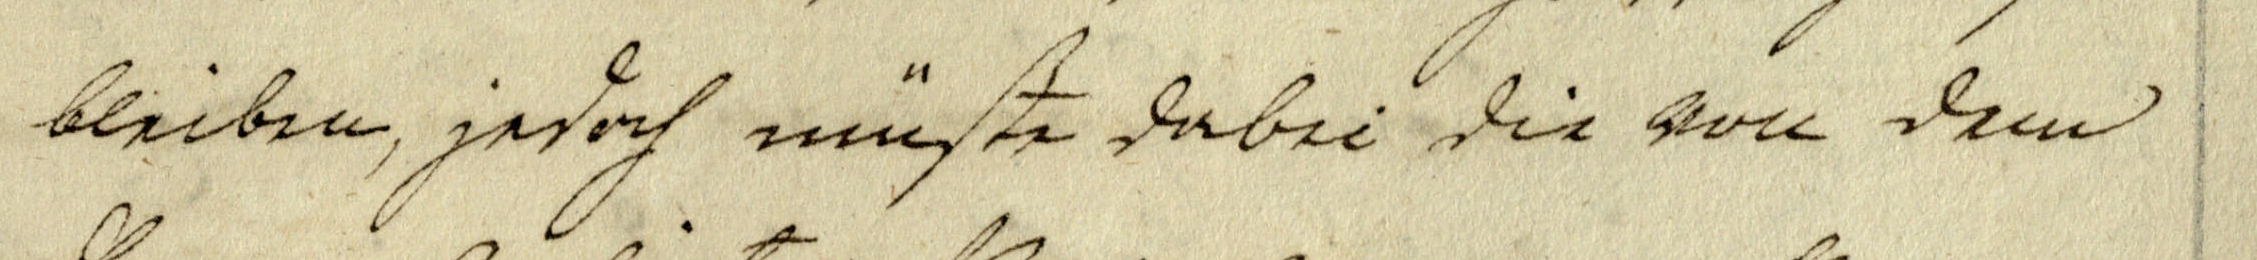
bleiben, jedoch müßte dabei die von dem
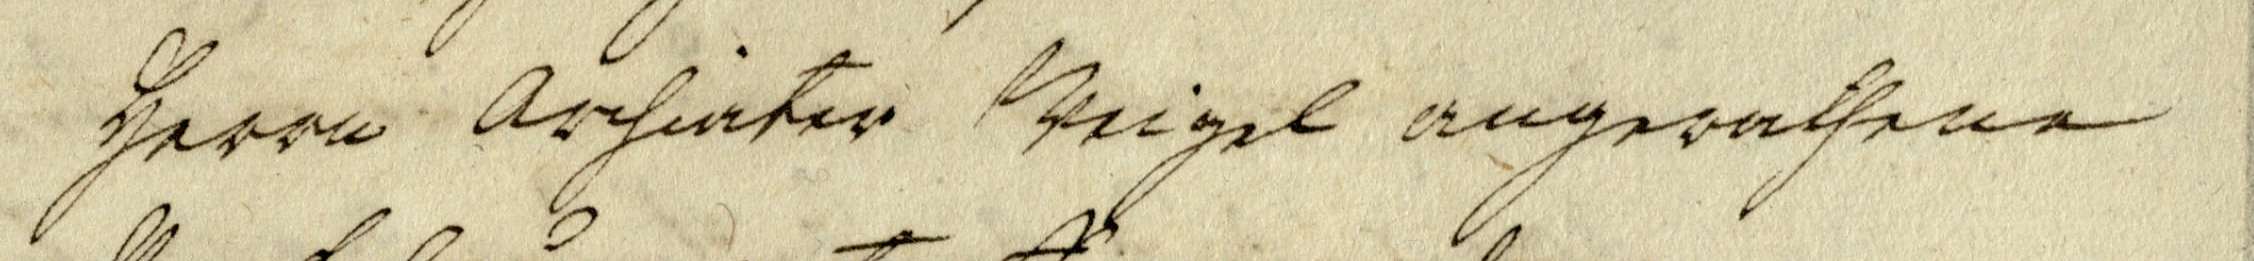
Herrn Archiater Weigel angerathene
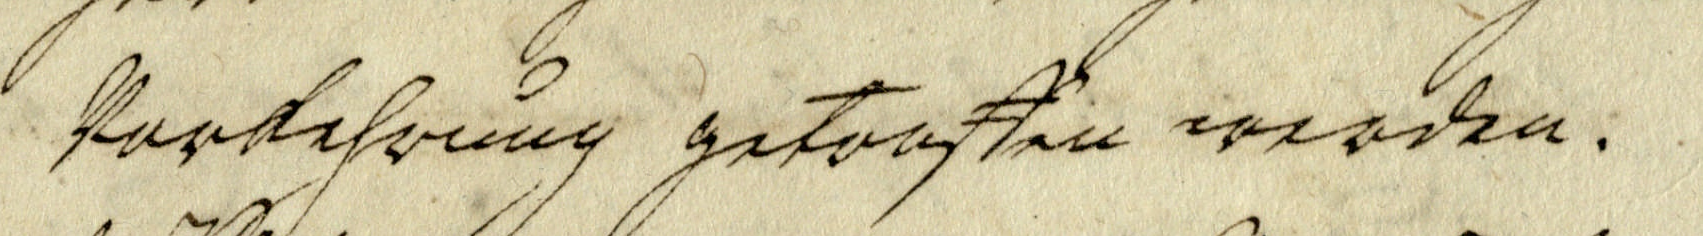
Vorkehrung getroffen werden.
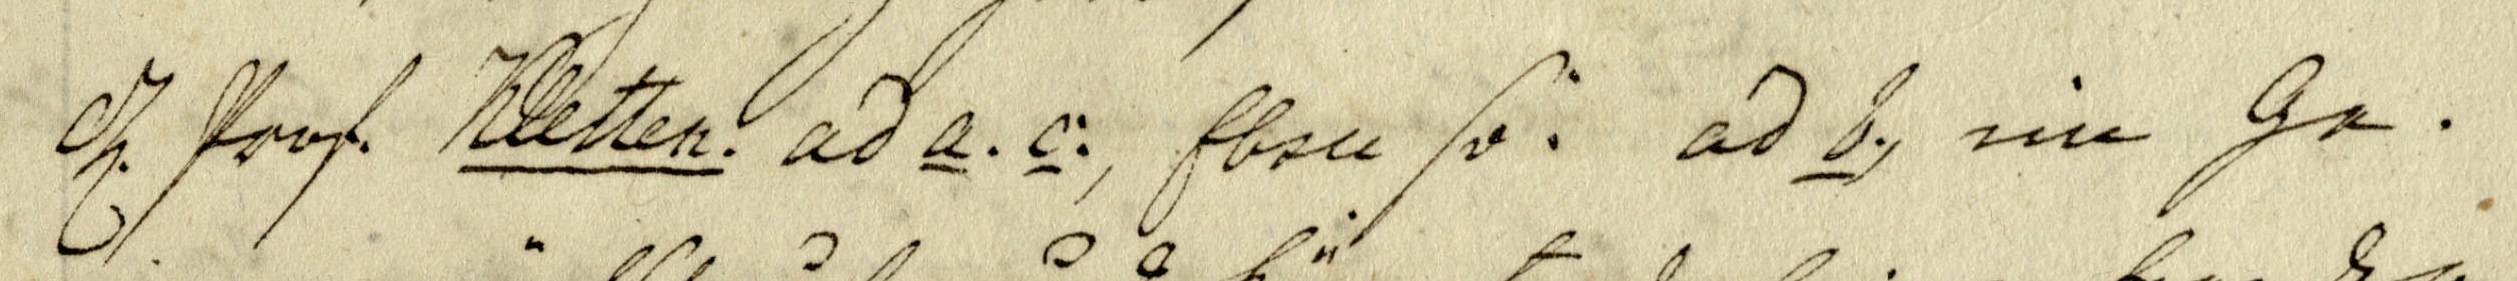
dh. Prof. Kletten. ad a. c. Eben so. ad b. im Ge¬
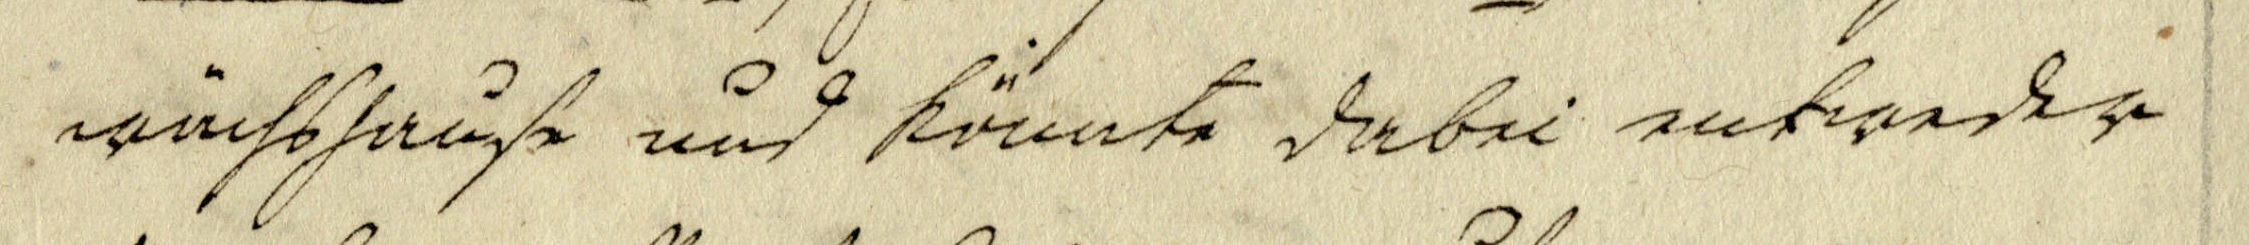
wächshause und könnte dabei entweder
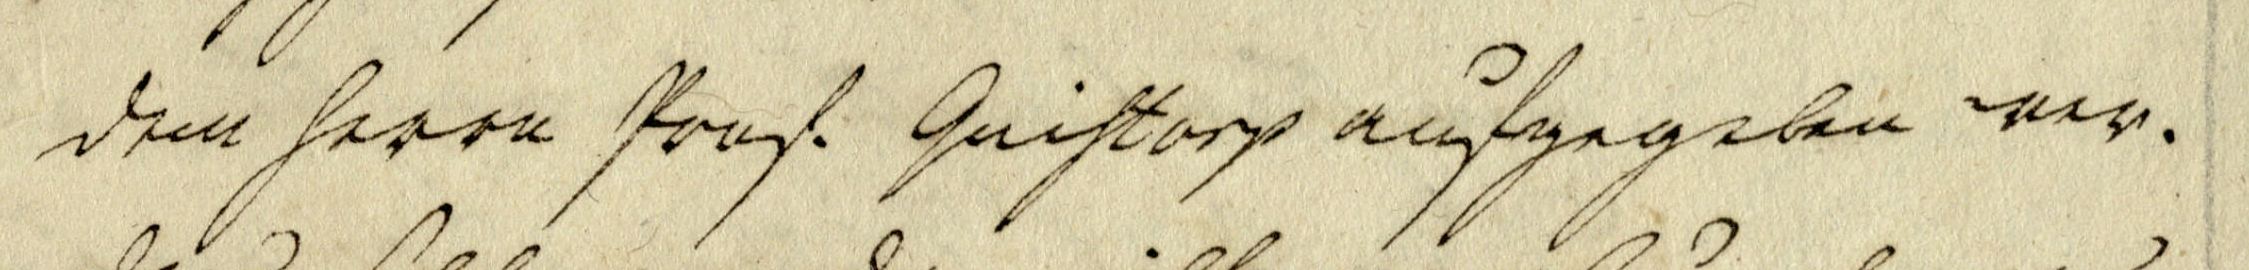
dem Herrn Prof. Quistorp aufgegeben wer¬
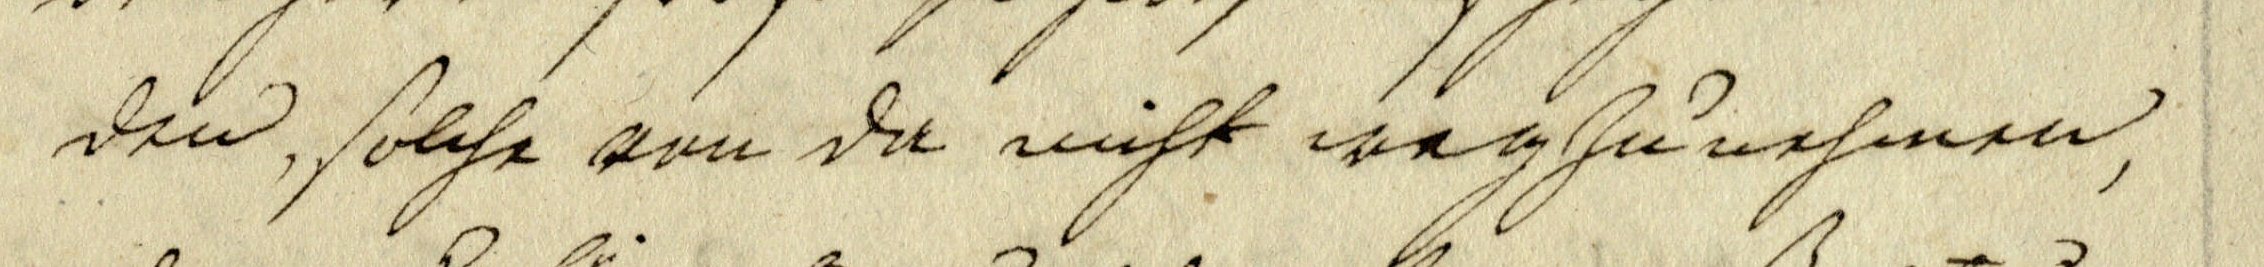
den, solche von da nicht wegzunehmen,
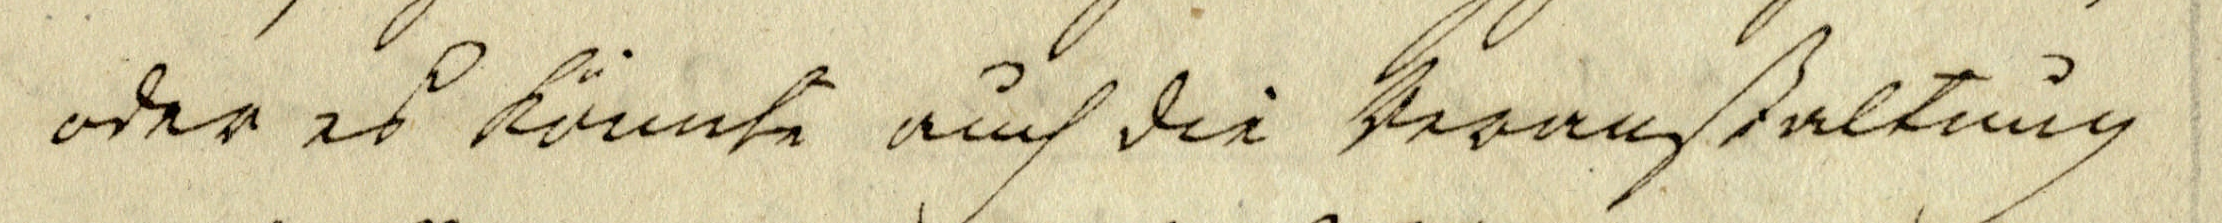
oder es könnte auch die Veranstaltung
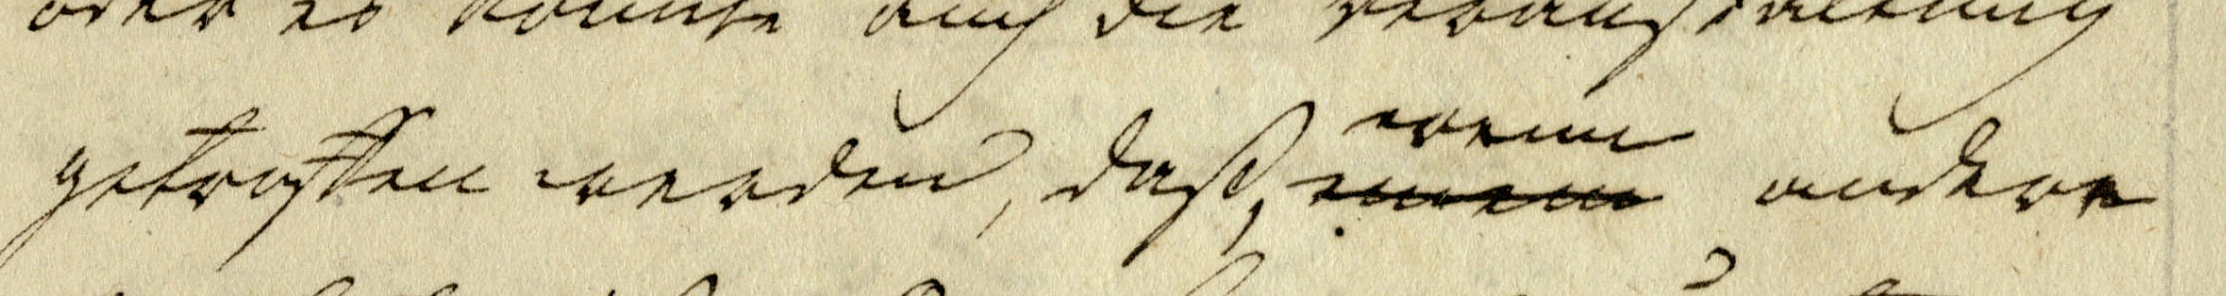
getroffen werden, daß wenn andere
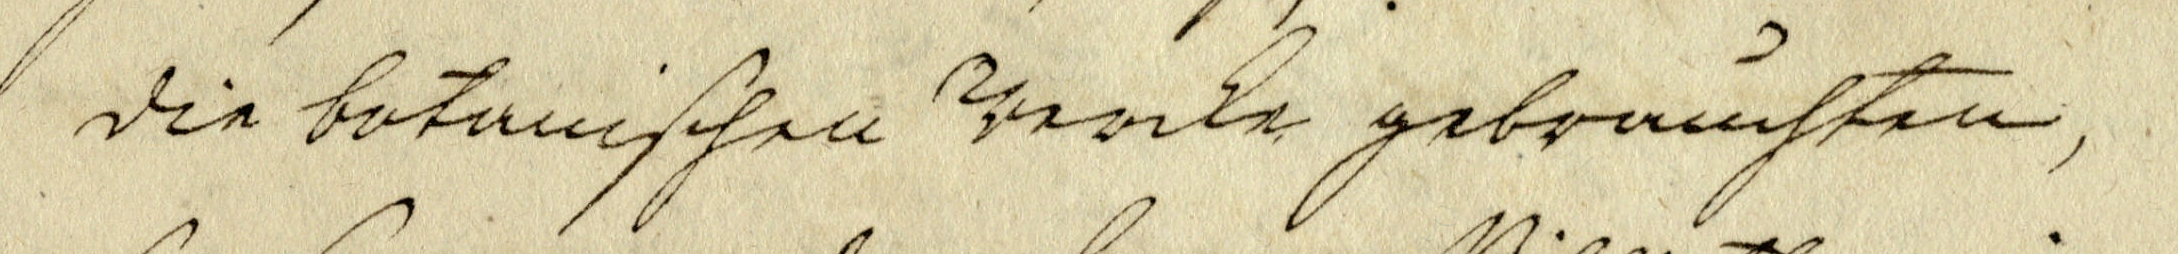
die botanischen Wercke gebrauchten,
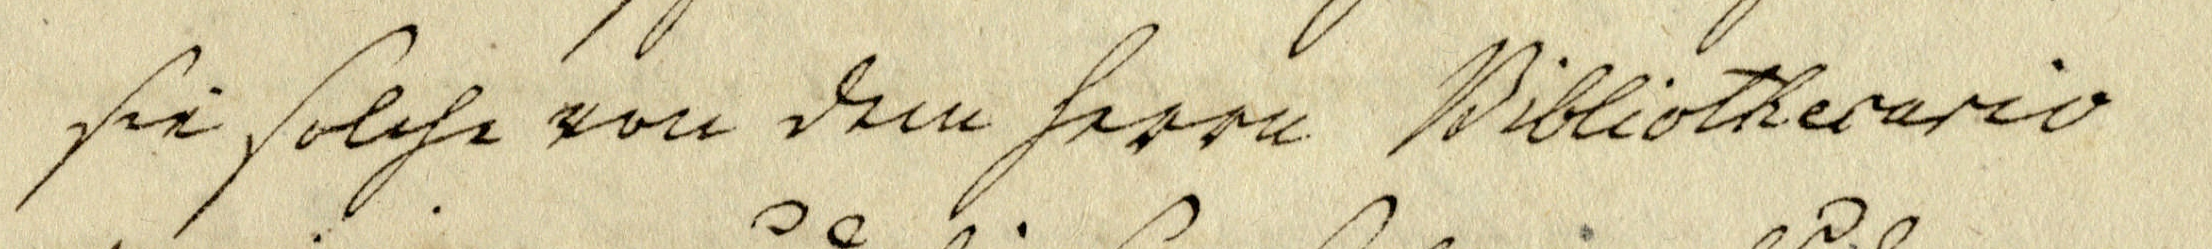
sie solche von dem Herrn Bibliothecario
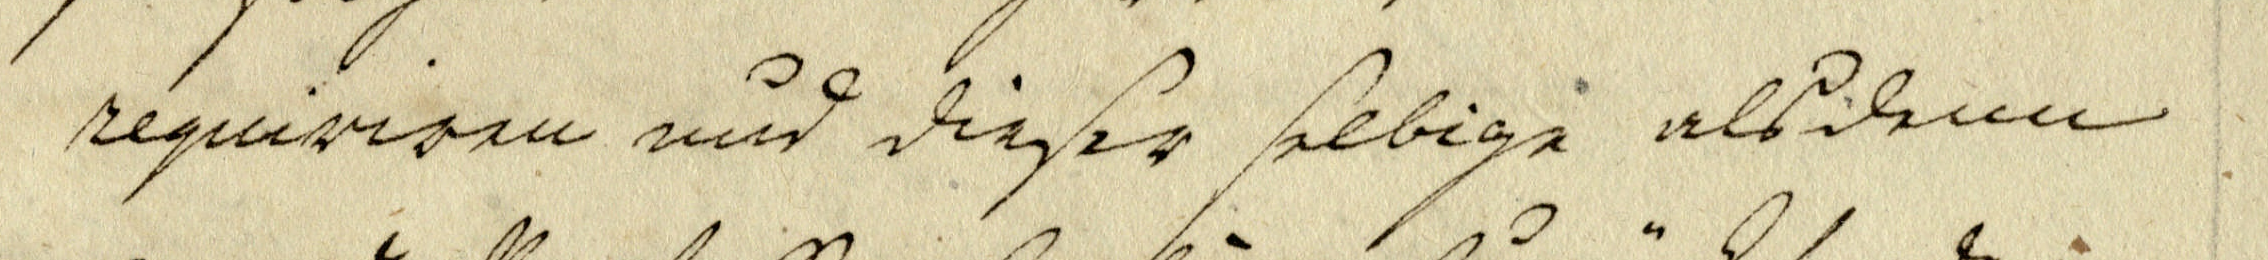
requiriren und dieser selbige als denn
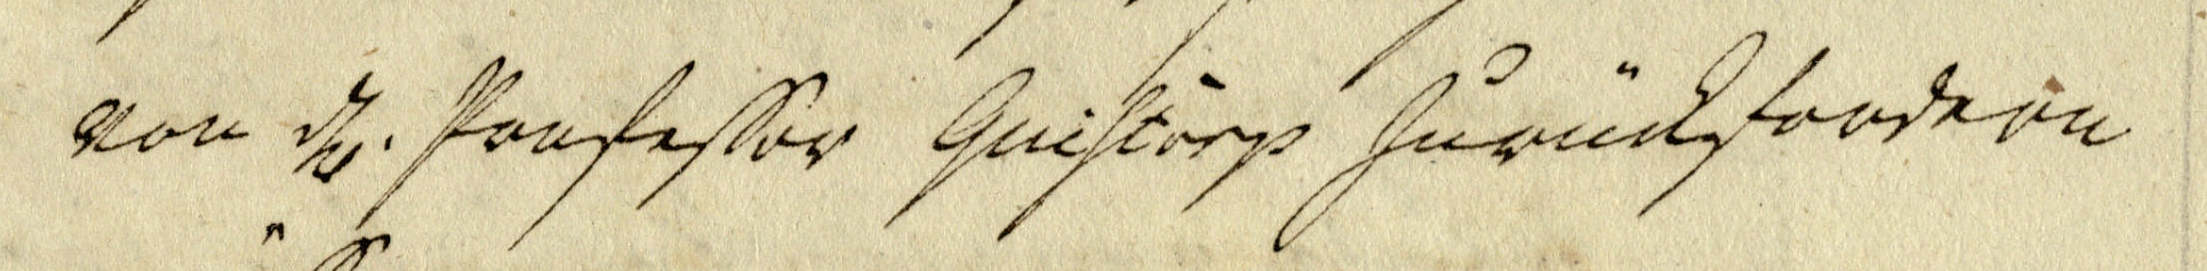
von dh. Professor Quistorp zurückfordern
